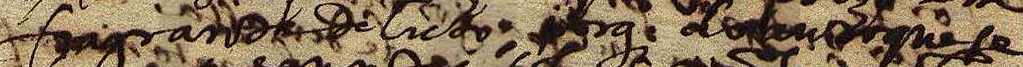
fragrante delicto porq. do auto que se
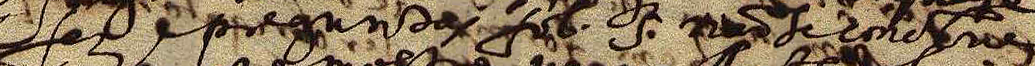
fez e preguntas fol. 3. naõ se conclue
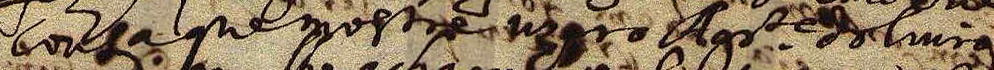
cousa que mostre uzar o Agrt.e do liuro
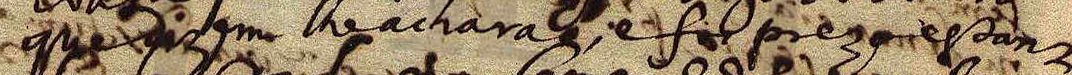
que dizem lhe acharaõ, e foi prezo estan
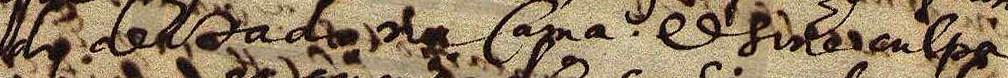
do deitado na Cama. et sine culpa
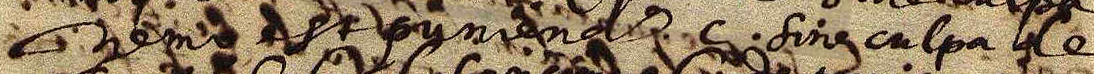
nemo est puniend. c. sine culpa de
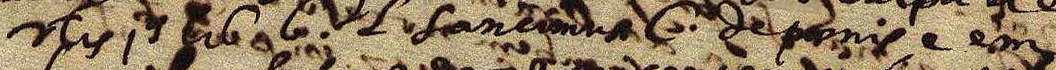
rl̄is Is lib 6. L sancimus C. de pœnis e em
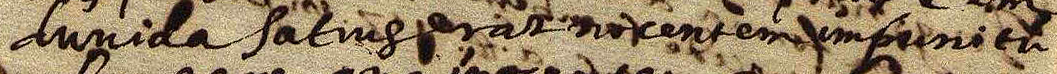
duuida satius erat nocentem impunitu
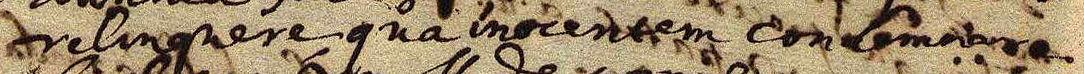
relinquere qua inocentem condemnaro
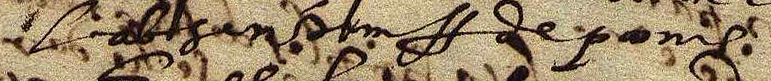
L absentum ff de pœnis.
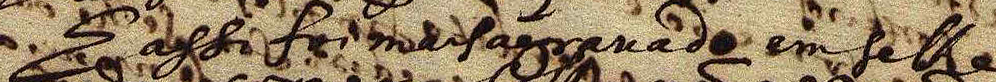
E assi foi mais agrauado em se lhe
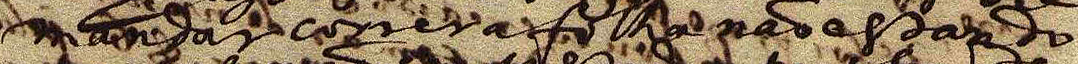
mandar correr a folha naõ estando
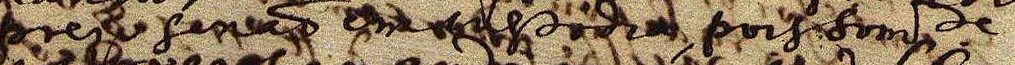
preso senaõ em custodia, pois somt.e
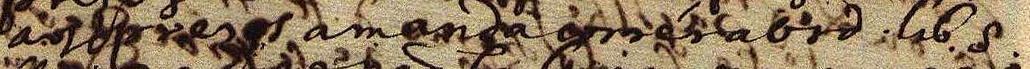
aos prezos a manda correr a ord. lib. 5.
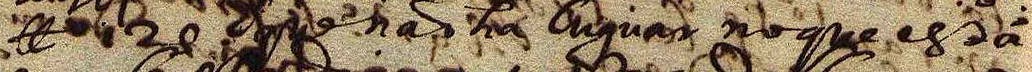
tto 125 que naõ ha luguar no que está
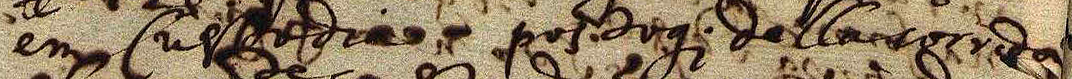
em Custodia posto q. della corrida
